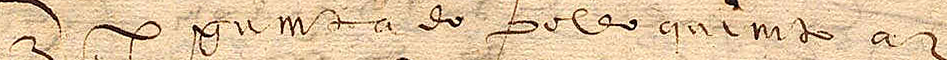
item ꝑgumtado pollo quimto ar
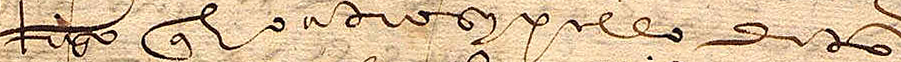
tigo q̄ houtrosy pello dito
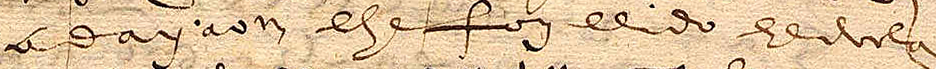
adayaom lhe foy llido he decla
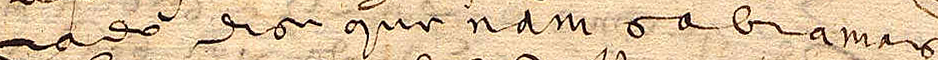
rado dise que nam sabia mais
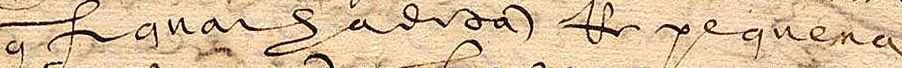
q̄ fiquar ha dita Re pequena
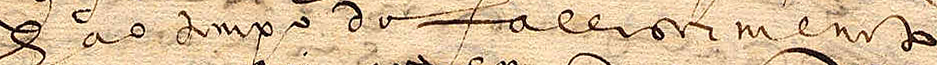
hao tempo do fallescimemto
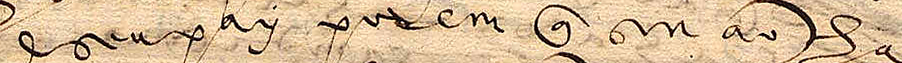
de seu pay porem q̄ se naõ ha
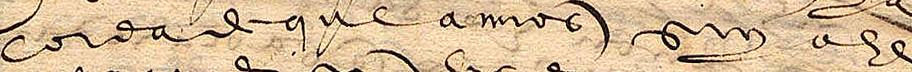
corda de que annos serya he
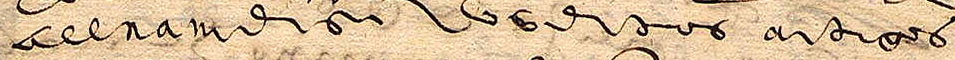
all nam dise dos ditos artigos
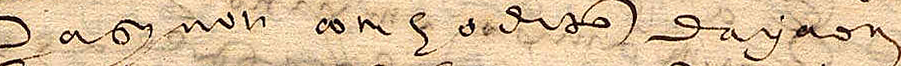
e asynou com ho dito dayaom
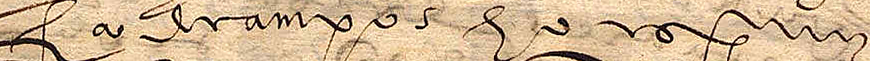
frco de campos ho esp̄uy
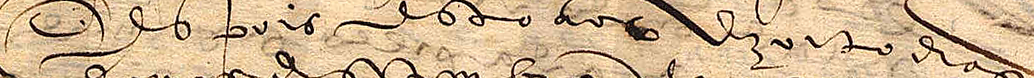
E despois desto aos dezoito dias
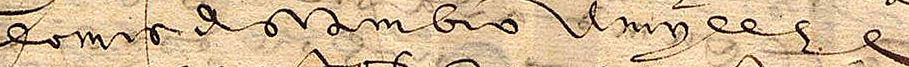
do mes de setembro de myll he
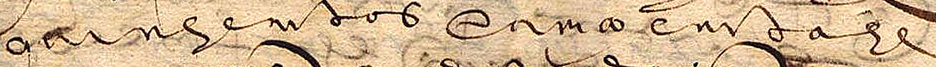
quinhemtos e çimcoemta he
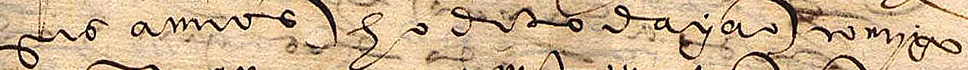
seis annos ho dito dayaõ comjgo
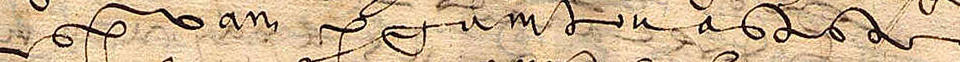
esp̄vam ꝑgumtou as teste
